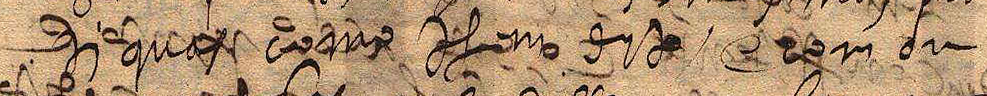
tjquas como them dyto / e com ou
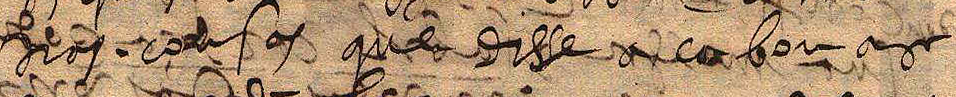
tras cousas que disse acabou a se
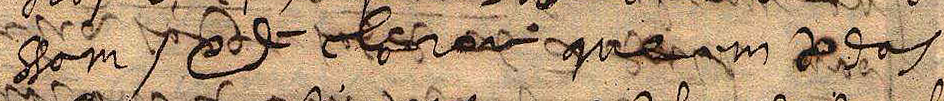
ssam / e declarou que em todas
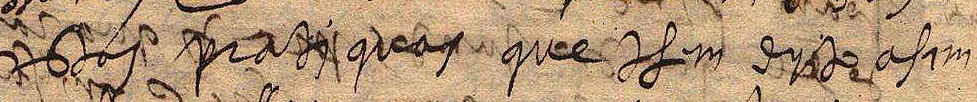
estas pratjquas que them dyto asim
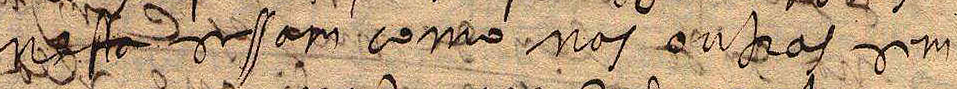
nesta sessam como nas outras sem
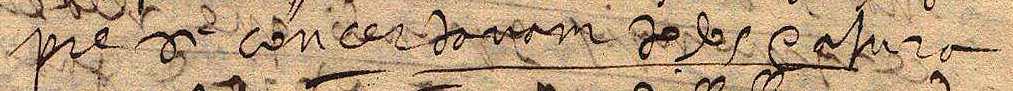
pre se concertauam todos e aJura
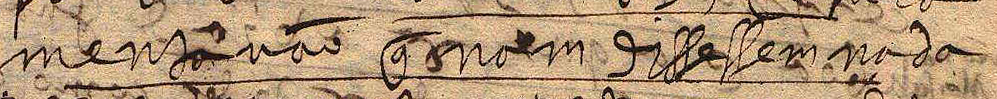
mentauão q̄ nam dyssessem nada
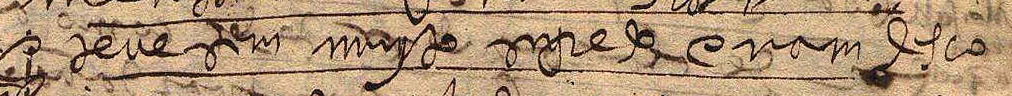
e teuesem muyto segredo e nam desco
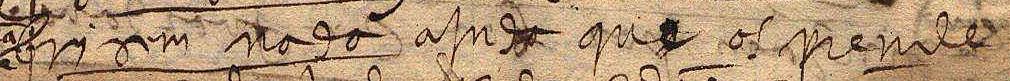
brysem nada aJnda que os prende
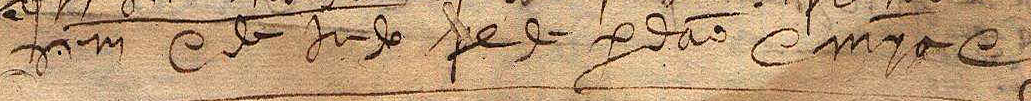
sem e de tudo pede ꝑdão e mȳa e
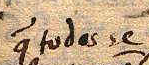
q̄ todos se
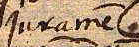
Juramē
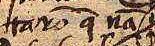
tarō q̄ nā
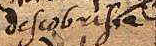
descobrissē
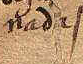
nada/
